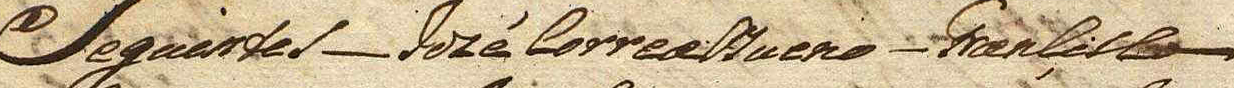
Seguintes — Iozé Correa Bueno — FranÇisCo
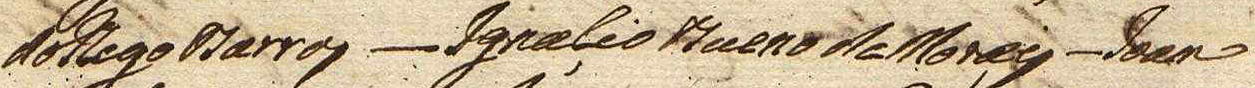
do Rego Barros — IgnaÇio Bueno Morais — Ioam
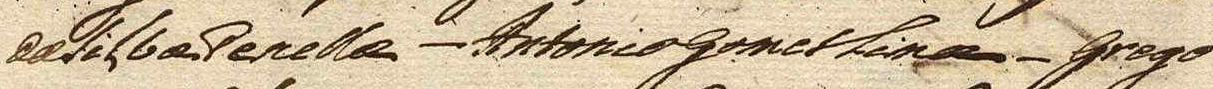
da Silva Penella — Antonio Gomes Lima — Grego
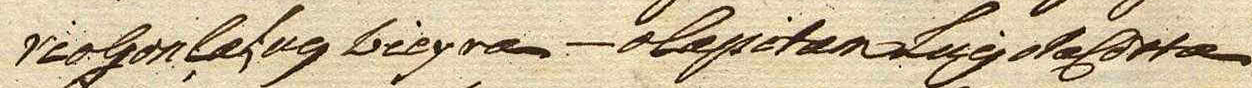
rio GonÇalves Vieyra — o Capitam Luis da Costa
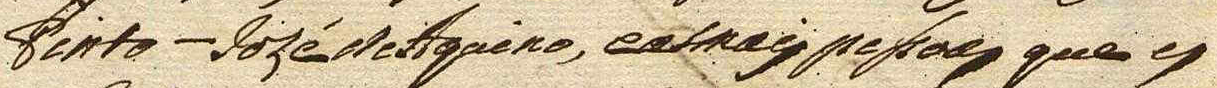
Pinto — Iozé de Aquino, e as mais pessoas que es
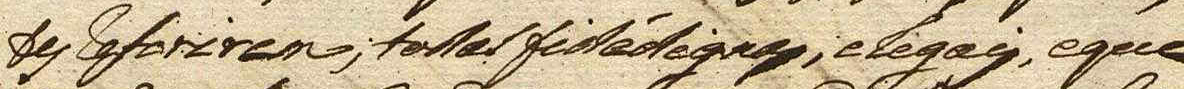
tes Referirem, todas fidédignas, e legais, e que
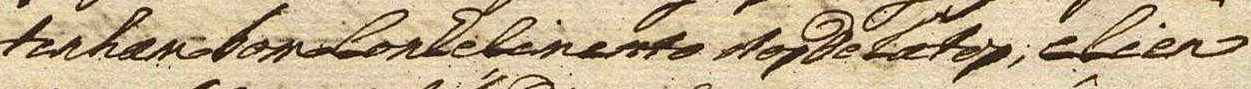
tenham bom ConheÇimento dos Delatos, e Çien
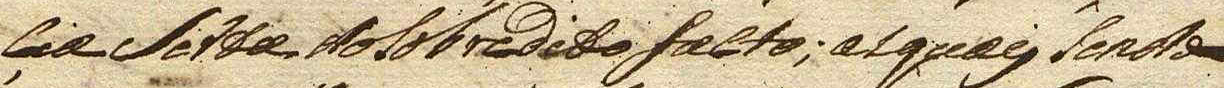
Çia Serta do sobredito facto; as quaes sendo
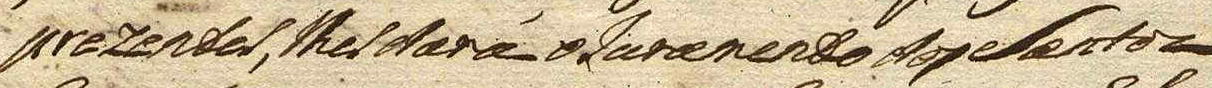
prezentes, lhes dará o Iuramento dos Santos
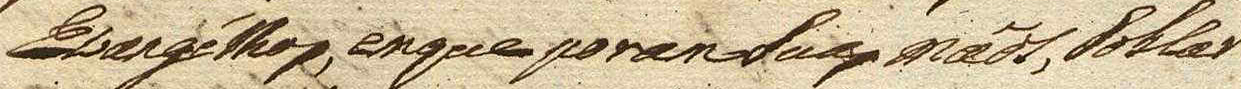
Evangélhos, em que poram Suas maõs, Sob Car
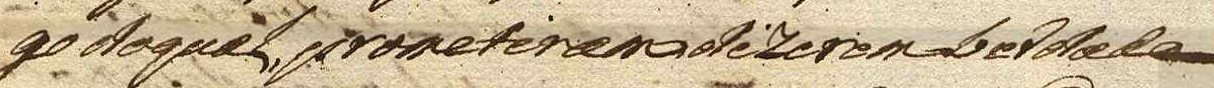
go do qual, prometiram dizerem verdade
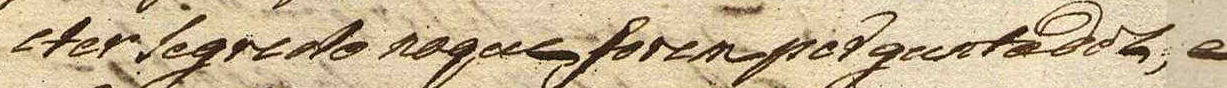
e ter segredo no que forem perguntadoz, e
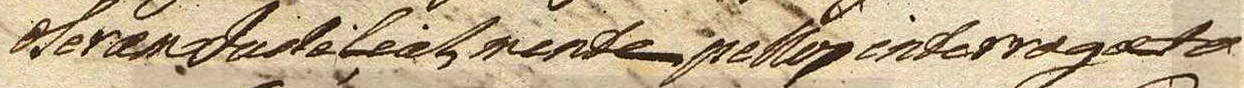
o seram IudiÇialmente pellos interrogato
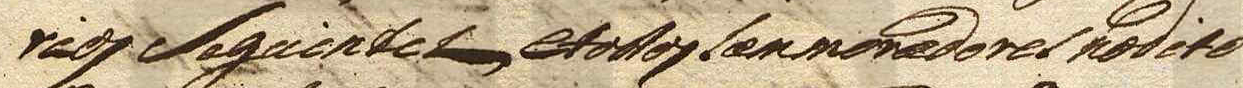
rios Seguintes e todos sam moradores no dito
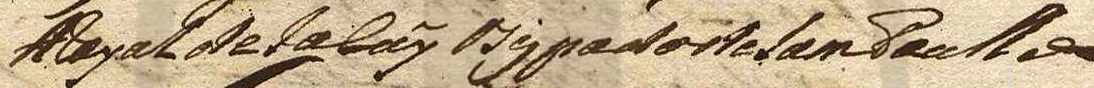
ARayal de IaCuŷ Bispado de Sam Paullo
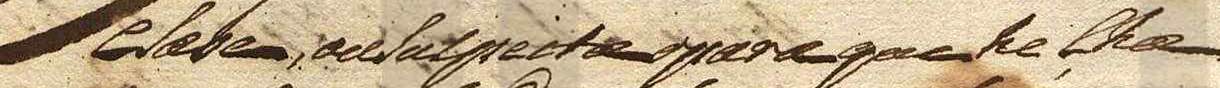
Se sabe, ou suspeita para que he Çha
